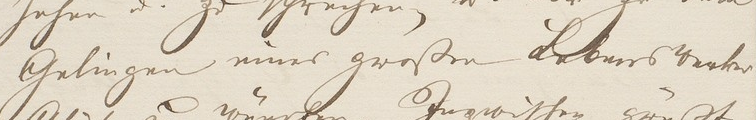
Gelingen eines großen Lebenswerkes
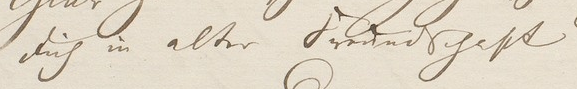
Dich in alter Freundschaft
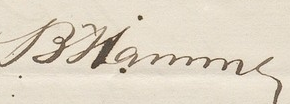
B Hammer
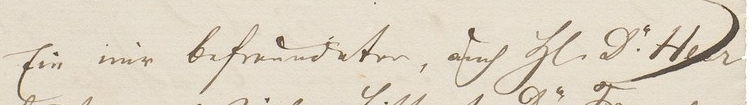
Ein mir befreundeter, auch Herrn DrHeer
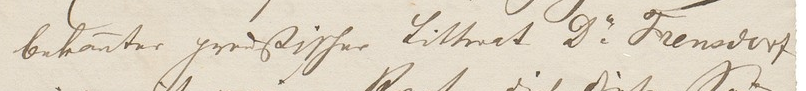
bekannter preußischer Litterat DrFrensdorf
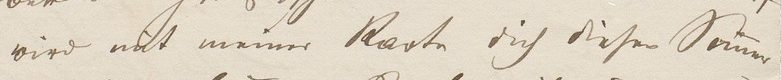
wird mit meiner Karte dich diesen Sommer
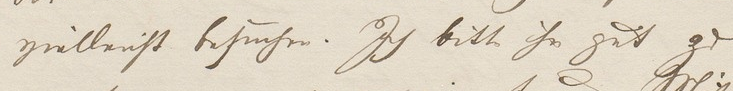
vielleicht besuchen. Ich bitte ihn gut zu
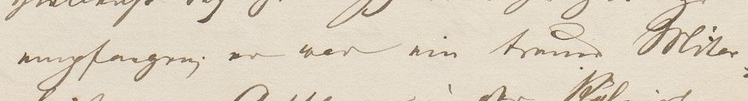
empfangen; er war ein treuer Mitar-
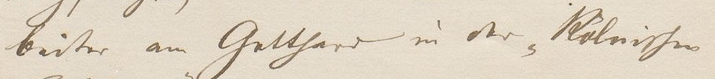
beiter am Gotthard in der «Kölnischen
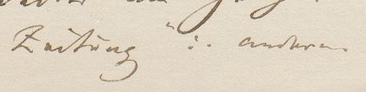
Zeitung» u. anderen.
